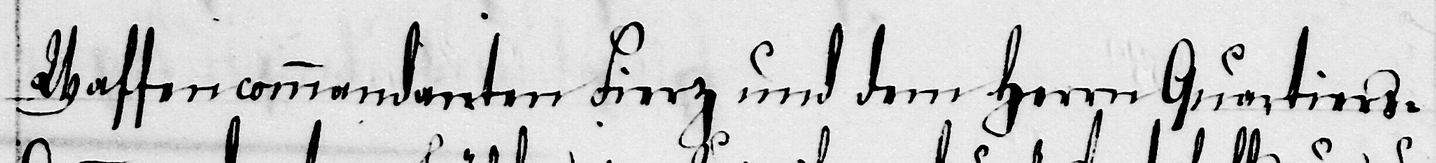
Waffencommandanten Fierz und dem Herrn Quartier¬
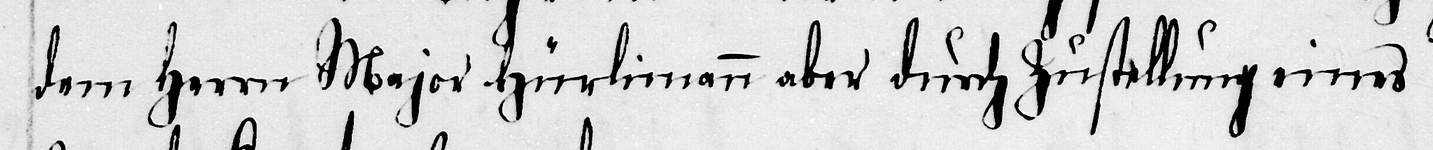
dem Herrn Major Hürlimann aber durch Zustellung eines
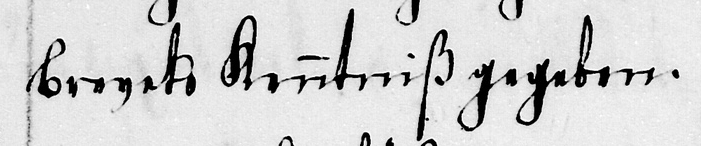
Brevets Kenntniß gegeben.
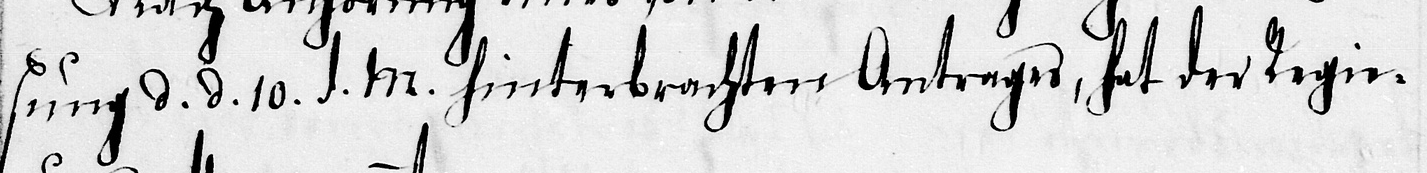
sung d. d. 10. d. M. hinterbrachten Antrages, hat der Regie¬
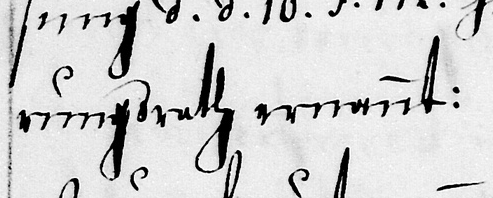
rungsrath ernannt:
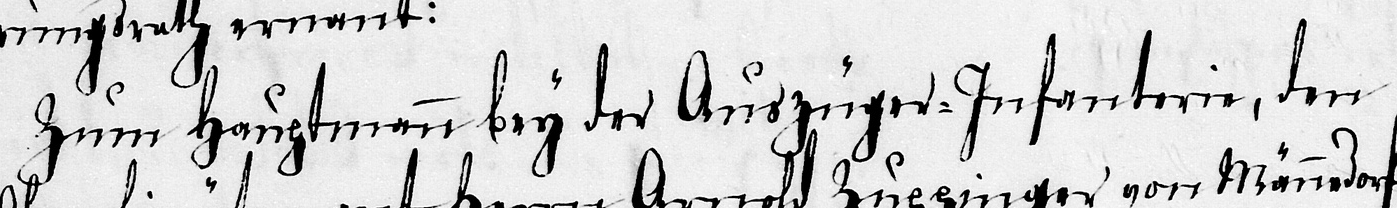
Zum Hauptmann bey der Auszüger-Infanterie, den
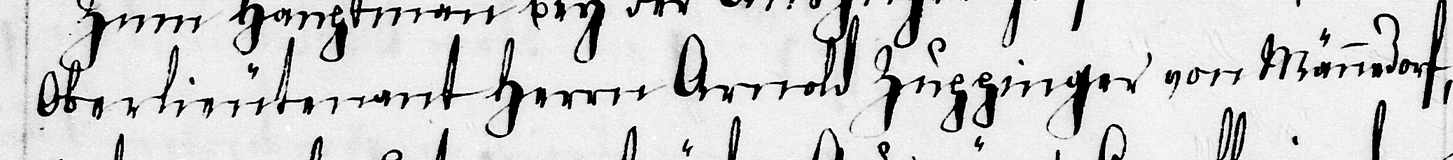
Oberlieutenant Herrn Arnold Zuppinger von Männedor¬
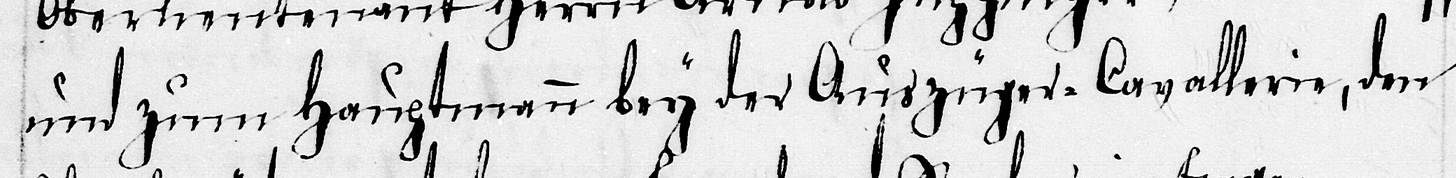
und zum Hauptmann bey der Auszüger-Cavallerie, den
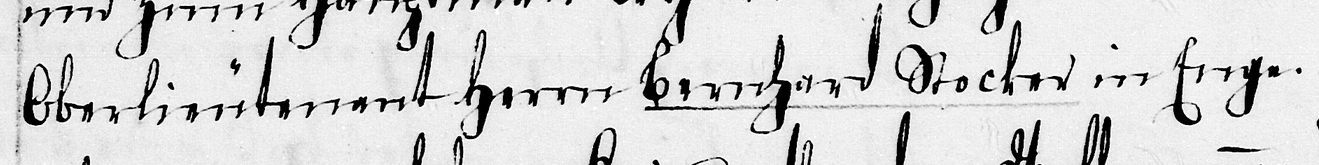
Oberlieutenant Herrn Bernhard Stocker in Enge.
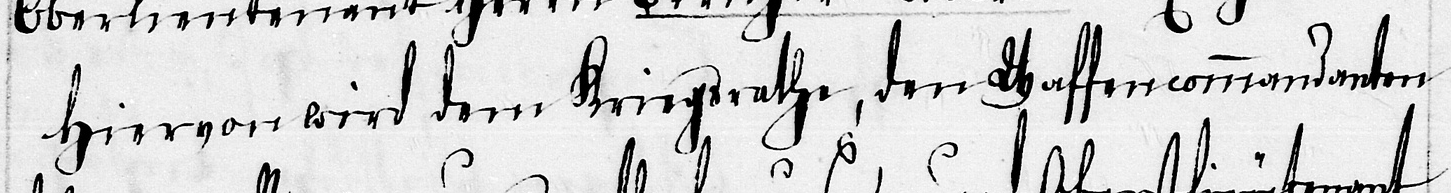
Hiervon wird dem Kriegsrathe, den Waffencommandanten
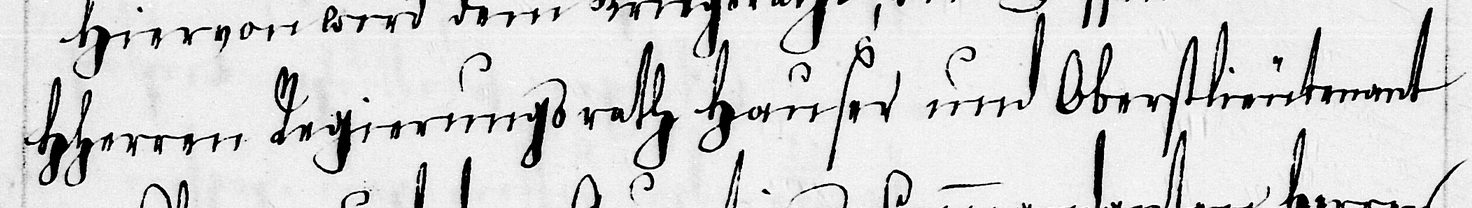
HHerren Regierungsrath Hauser und Oberstlieutenant
